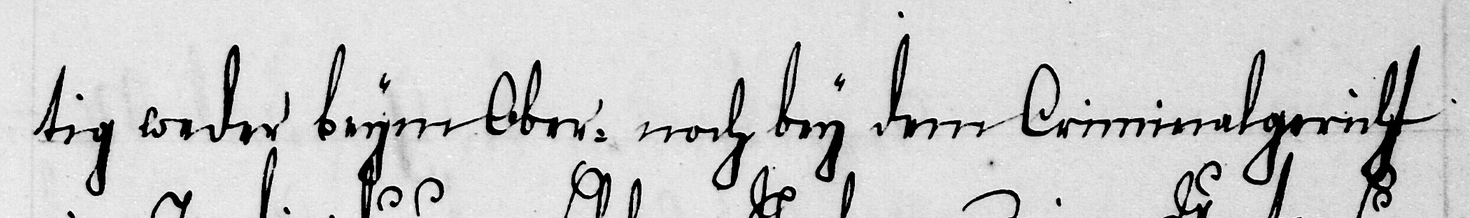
tig weder beym Ober- noch bey dem Criminalgericht
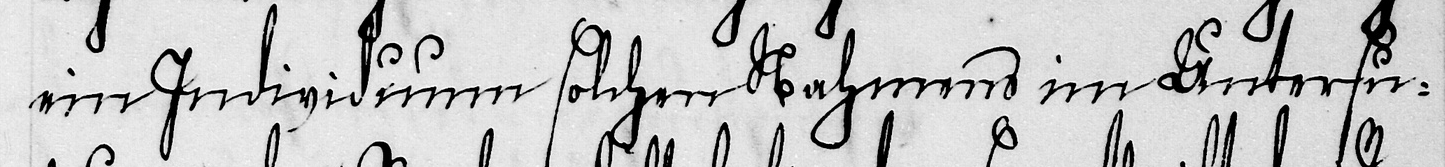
ein Individuum solchen Nahmens im Untersu¬
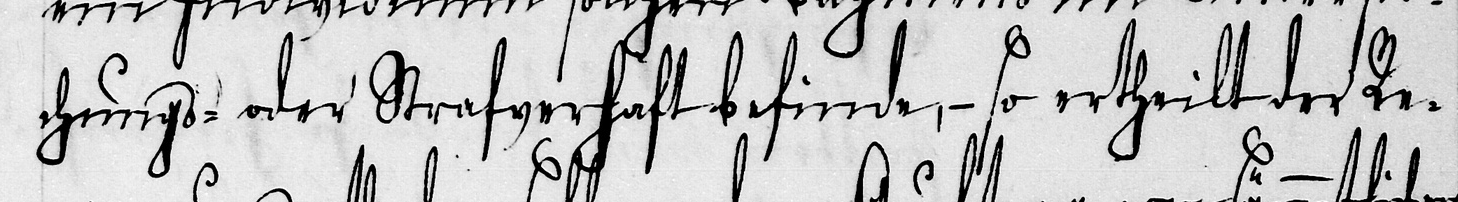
chungs- oder Strafverhaft befinde, – so ertheilt der Re¬
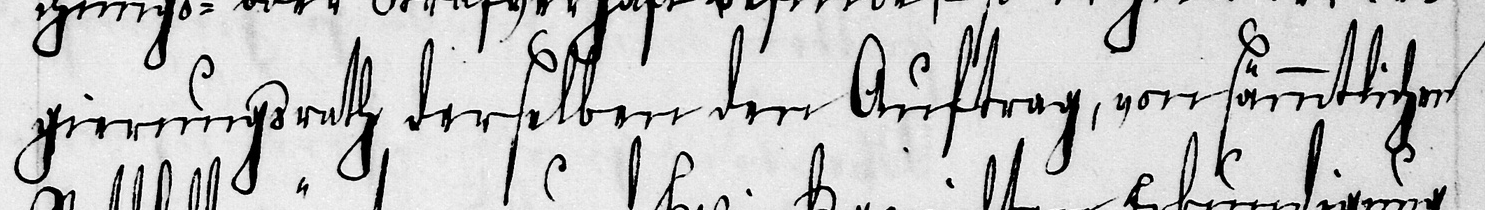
gierungsrath derselben den Auftrag, von sämmtlichen
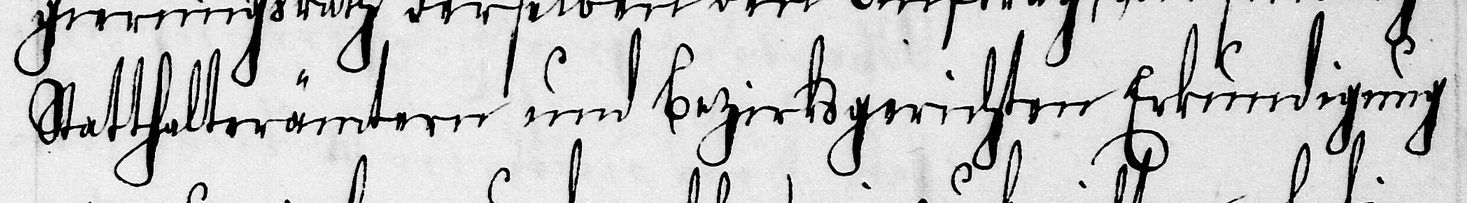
Statthalterämtern und Bezirksgerichten Erkundigung
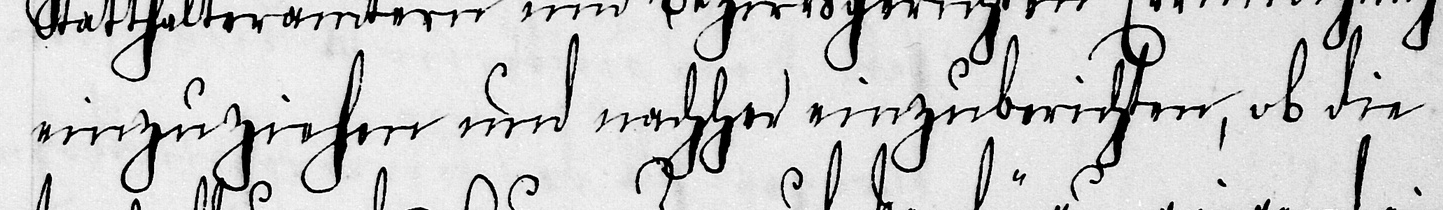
einzuziehen und nachher einzuberichten, ob die
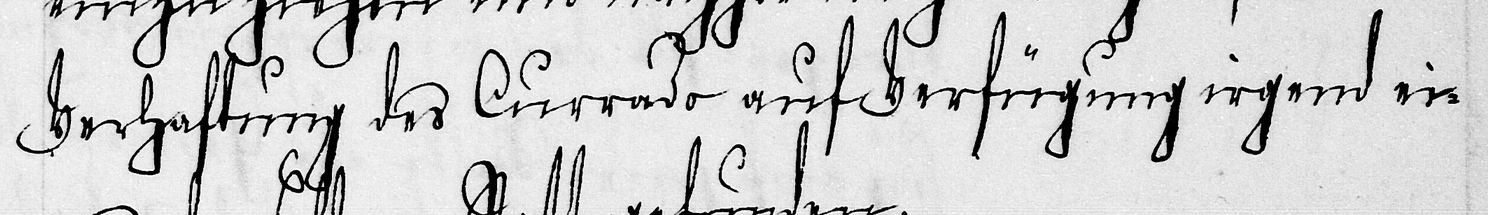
Verhaftung des Currado auf Verfügung irgend ei¬
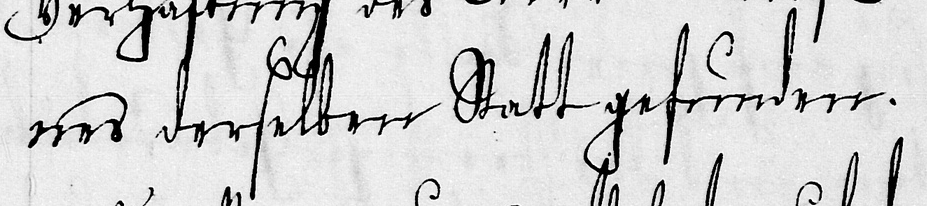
nes derselben Statt gefunden.
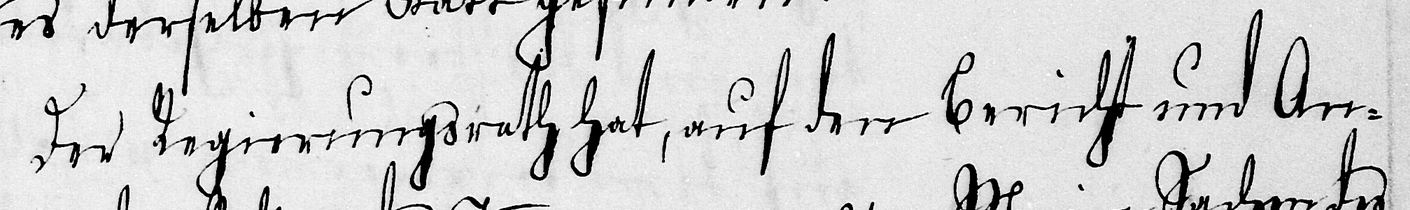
Der Regierungsrath hat, auf den Bericht und An¬
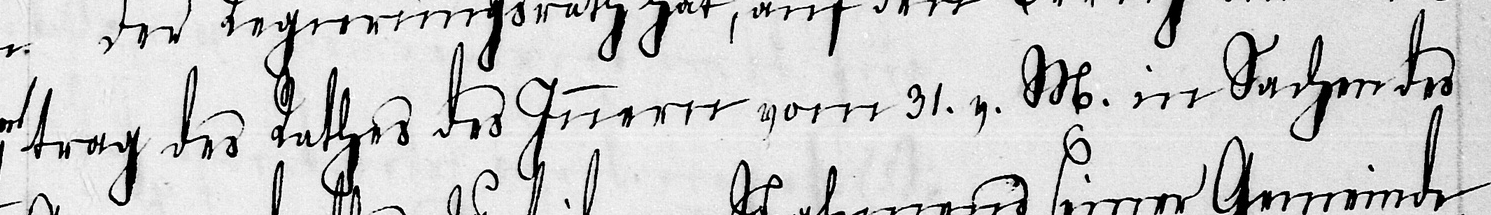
trag des Rathes des Innern vom 31. v. M. in Sachen des
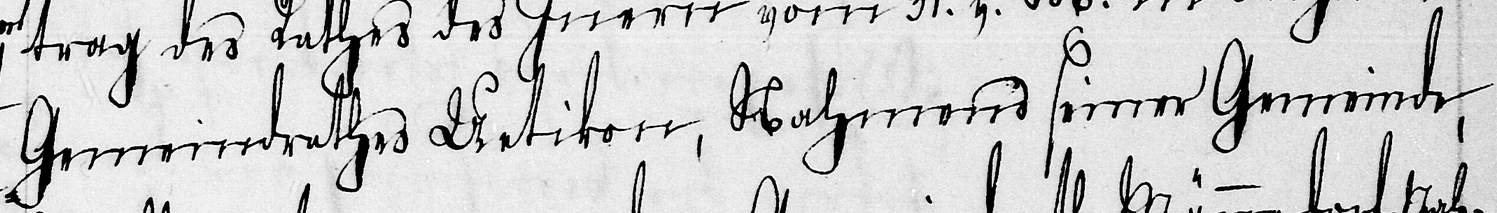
Gemeindrathes Uetikon, Nahmens seiner Gemeinde,
